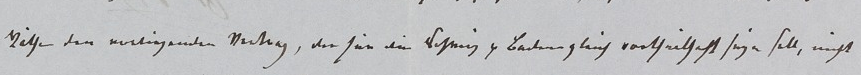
Räthe den vorliegenden Vertrag, der für die Schweiz & Baden gleich vortheilhaft seyn soll, nicht
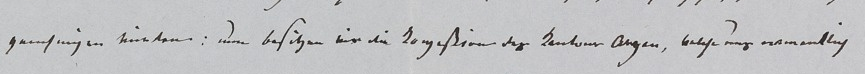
genehmigen würden: nun besitzen wir die Konzeßion des Kantons Argau, welche uns namentlich
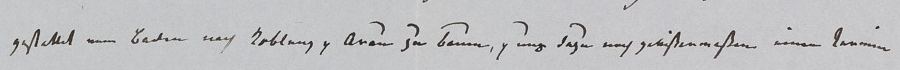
gestattet von Baden nach Koblenz & Arau zu bauen, & uns dazu noch gewißermaßen einen Termin
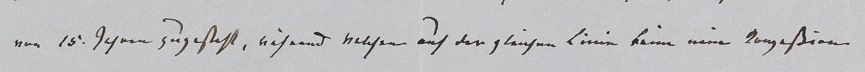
von 15. Jahren zugesteht, während welchem auf der gleichen Linie keine neue Konzeßion
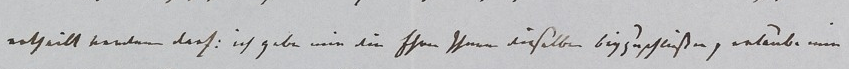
ertheilt werden darf: ich gebe mir die Ehre Ihnen dieselbe beyzuschließen, erlaube mir
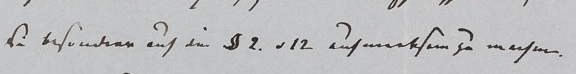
Sie besonders auf die § 2. u 12 aufmerksam zu machen.
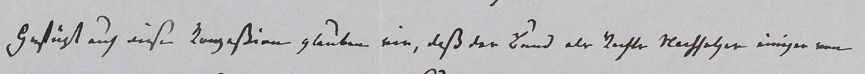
Gestüzt auf diese Konzeßion glauben wir, daß der Bund als Rechts Nachfolger einiger von
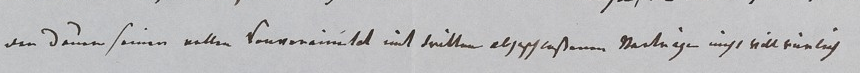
der Dauer seiner vollen Souverainität mit dritten abgeschloßenen Verträge nicht willkürlich
